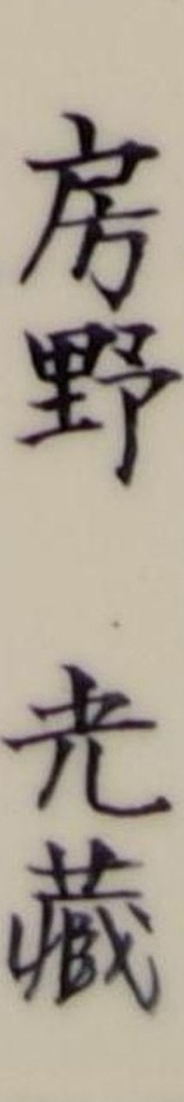房野光蔵
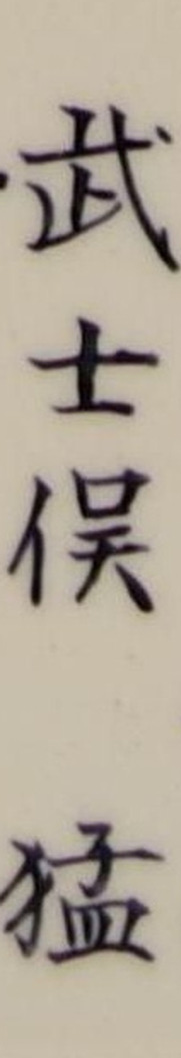武士俣猛
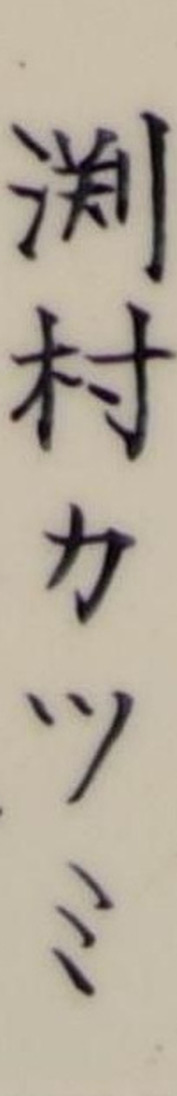淵村カツミ
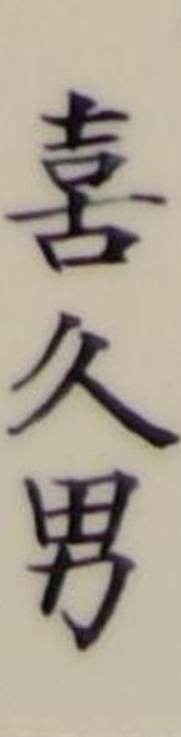喜久男
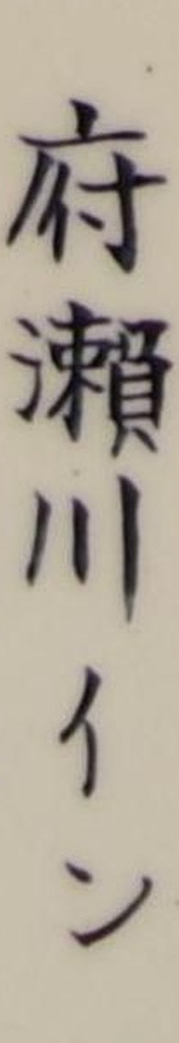府瀬川イン
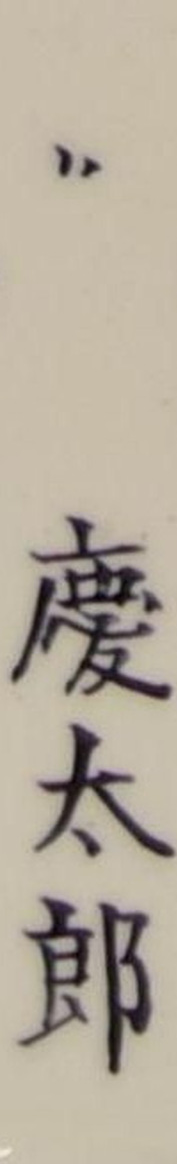慶太郎
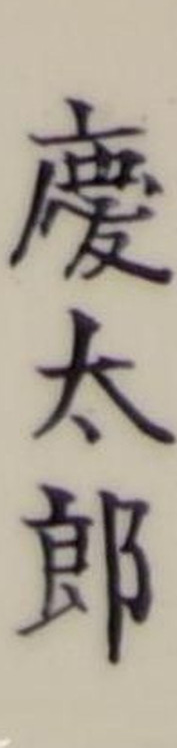慶太郎
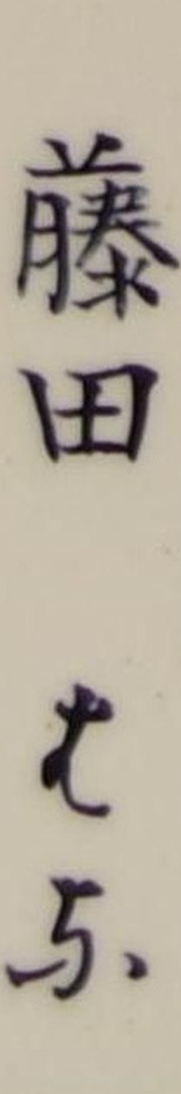藤田はな

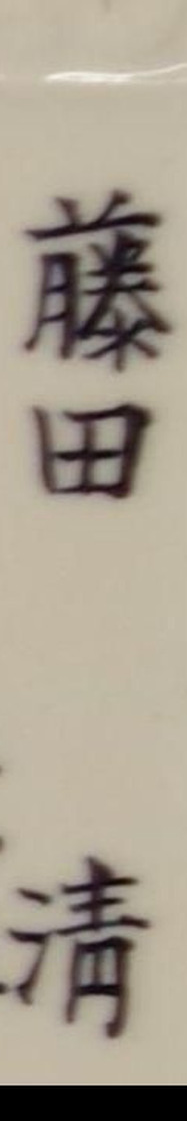藤田清
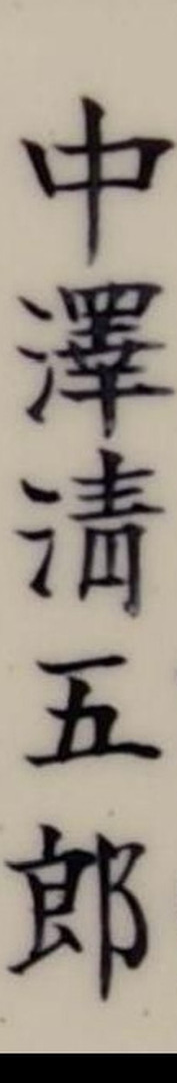中澤清五郎
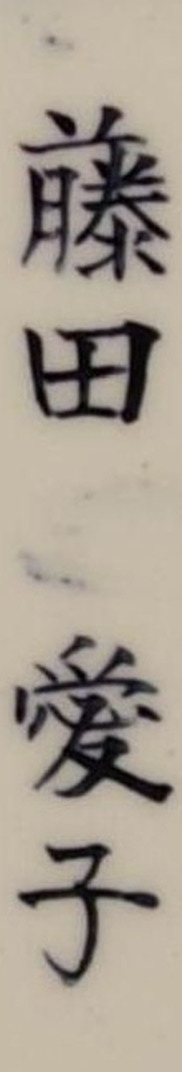藤田愛子
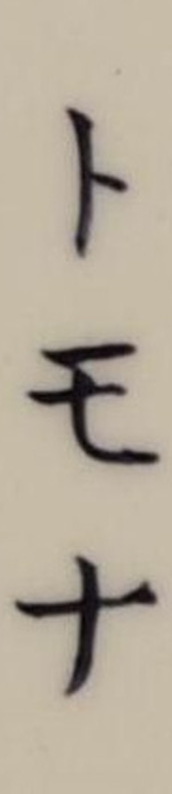トモナ
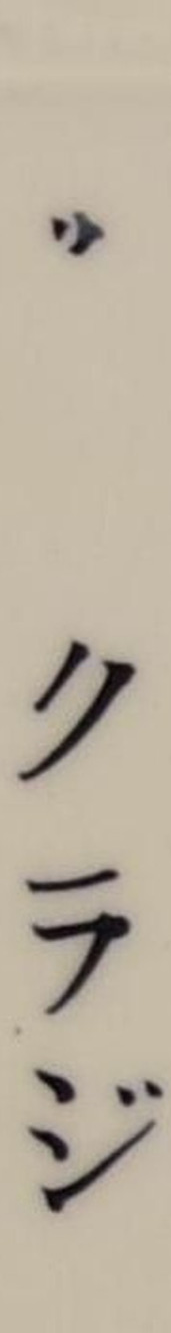クラジ
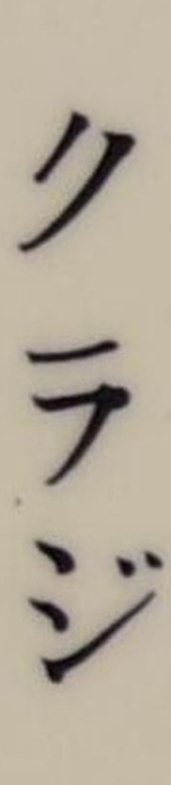クラジ
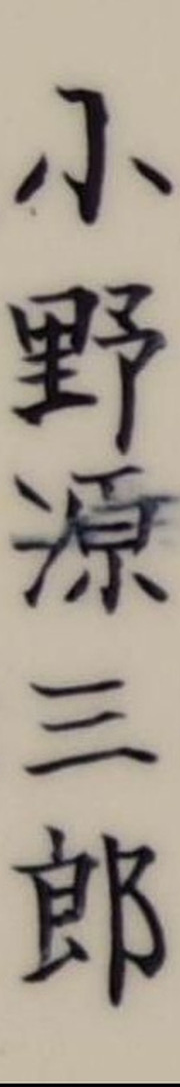小野源三郎
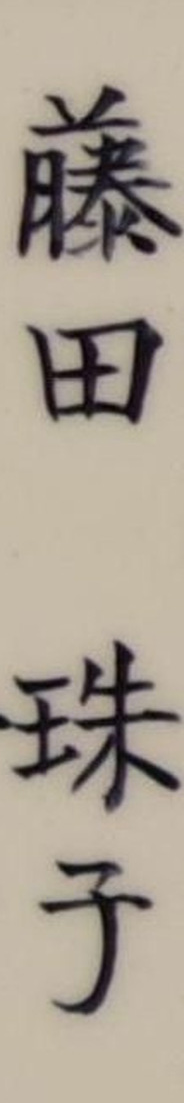藤田珠子
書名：E~L
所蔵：高野山金剛峯寺
